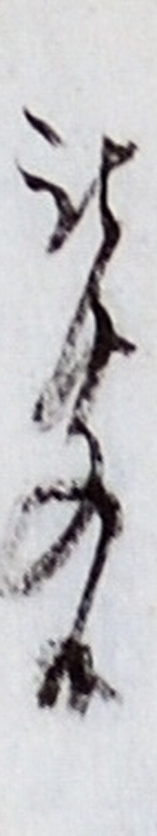被聞候
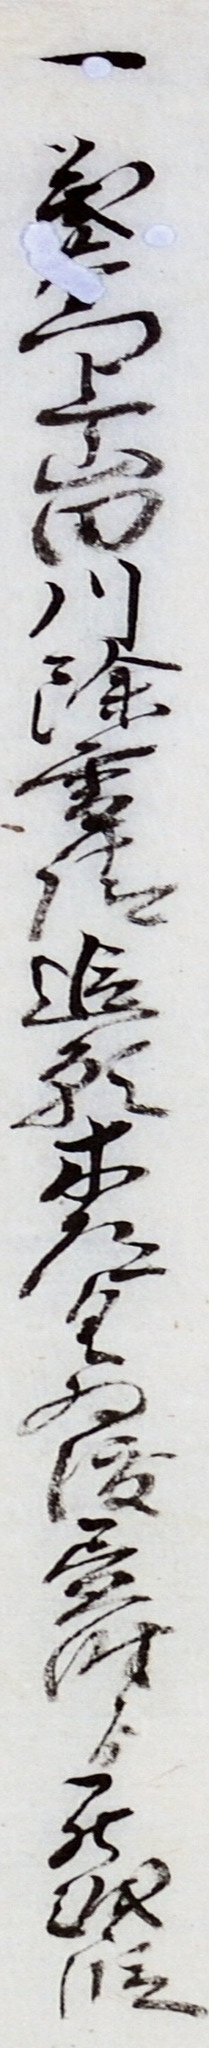一義右衛門上山田川除普請追頼木道具為渡昼時より罷越候段
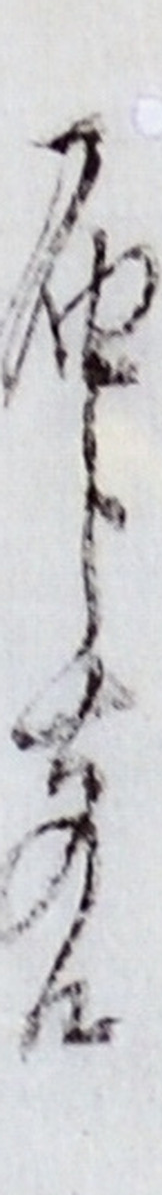届申聞候
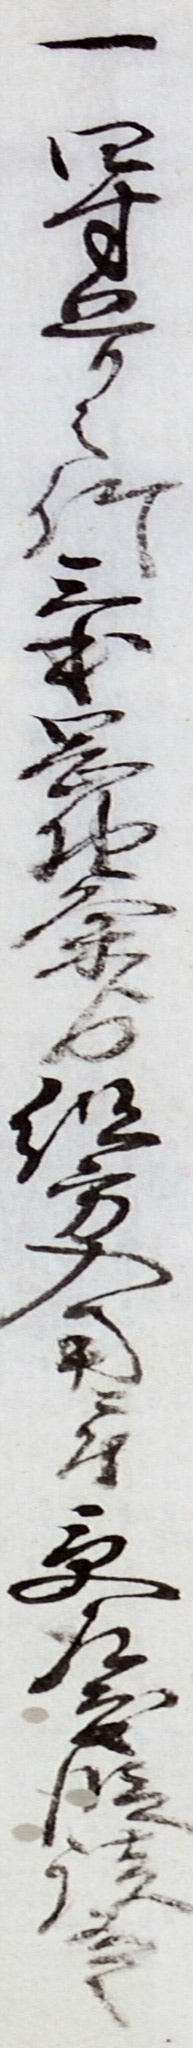一四半廻り之竹三本岡野倉右衛門組方入用ニ付受取置段談有之
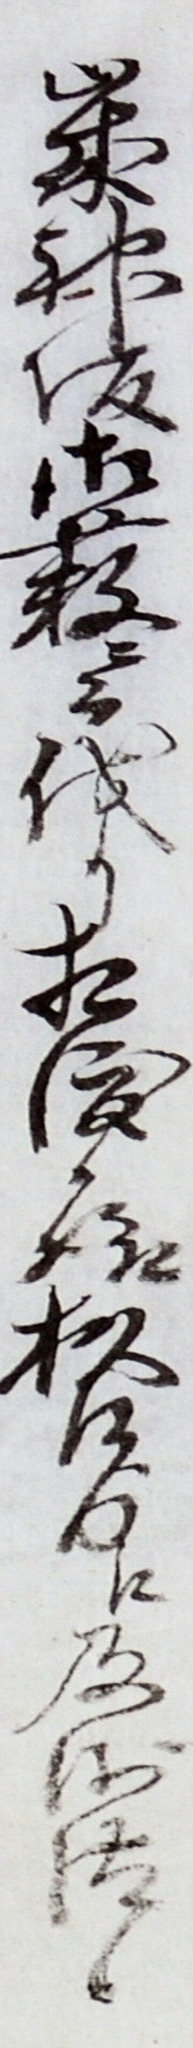歳神坂御藪ニ而伐り相渡候様杉右衛門江及沙汰候
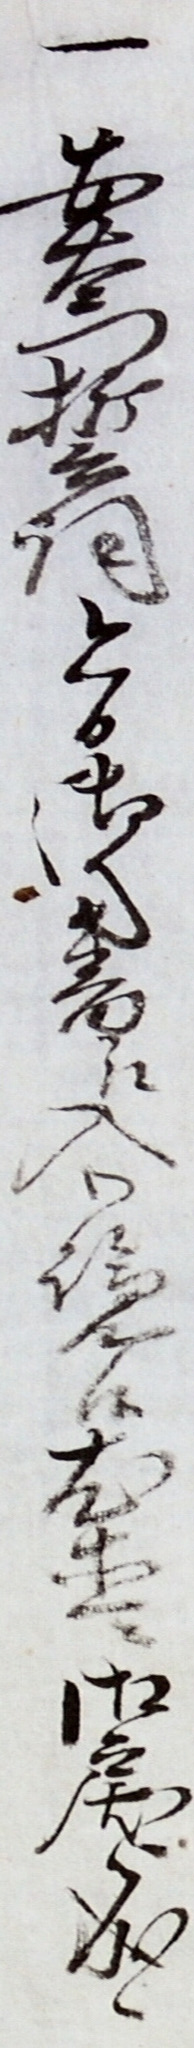一安右衛門誓詞と日御用番江入御覧候尤直ニ御戻被成候
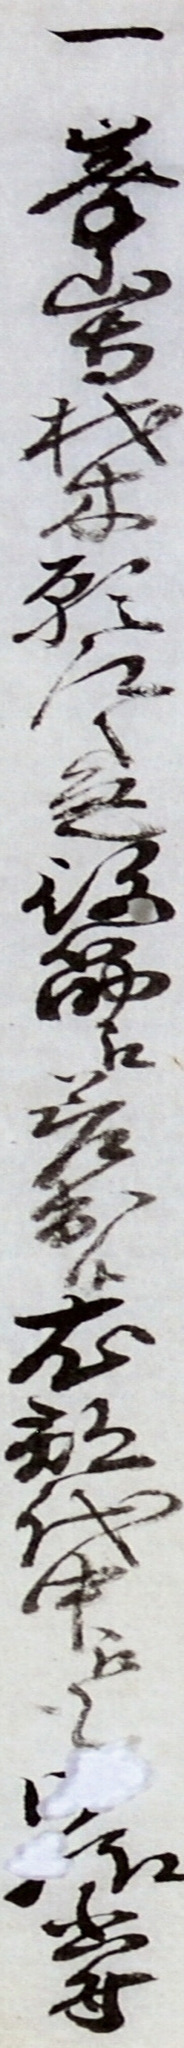一峯山寺材木願左之通役筋江差出候尤郡代中江も様書付
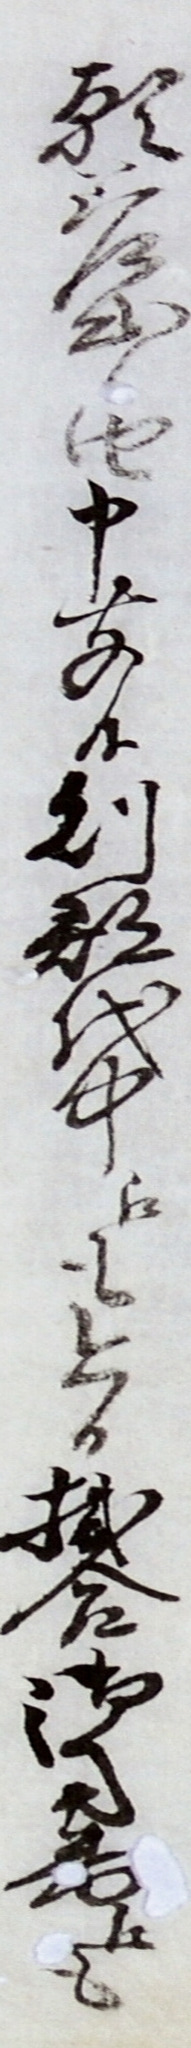一願差出候由申聞候則郡代中江も今日掛合御当番江も
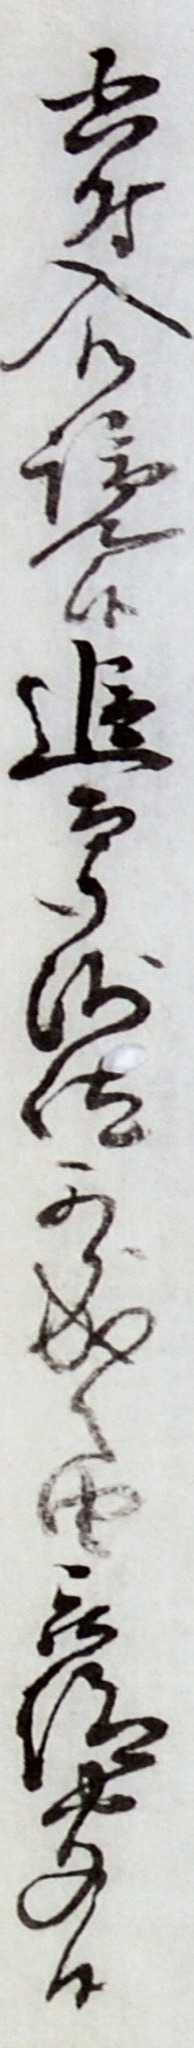書付入候覧候追而御沙汰可成候由被仰聞候

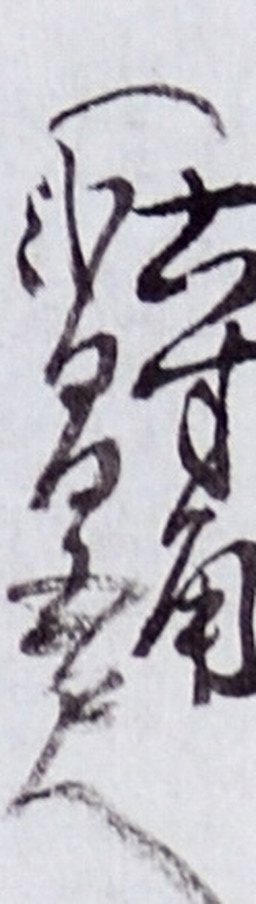弐間五尺
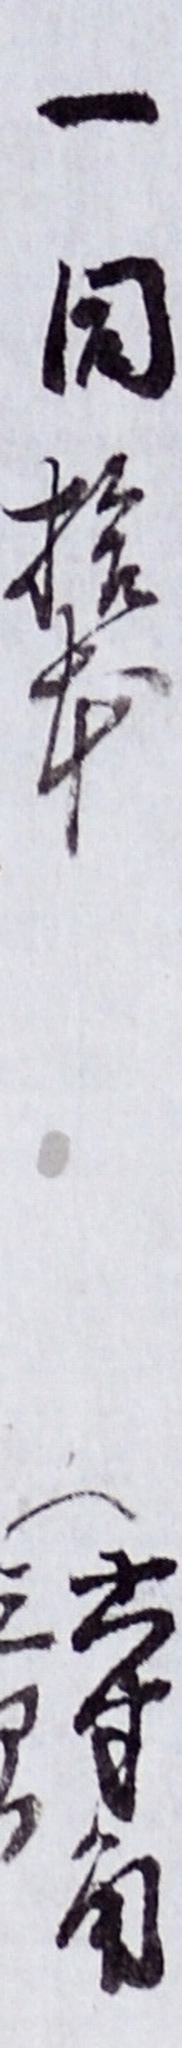一同拾本六寸角
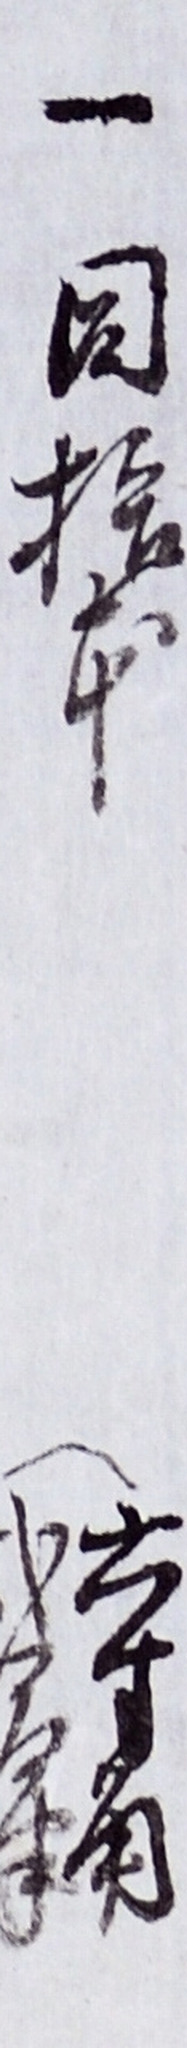一同拾本六寸角
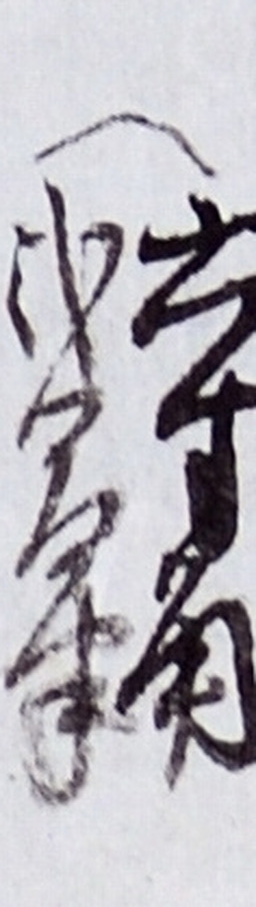弐間半
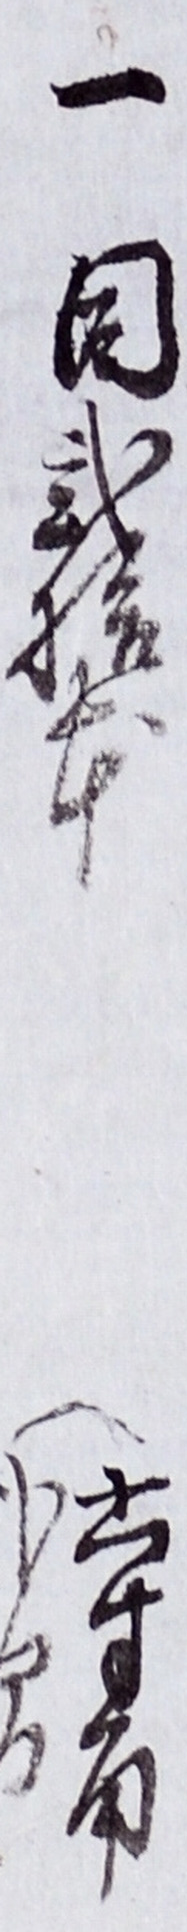一同弐拾本六寸角
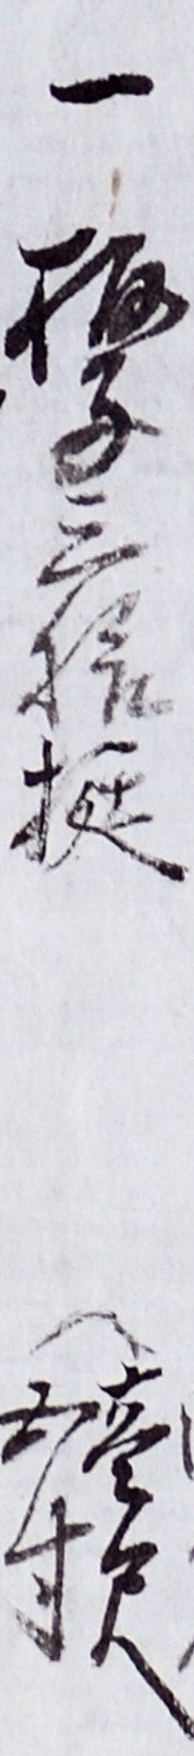一板子三拾挺壱尺
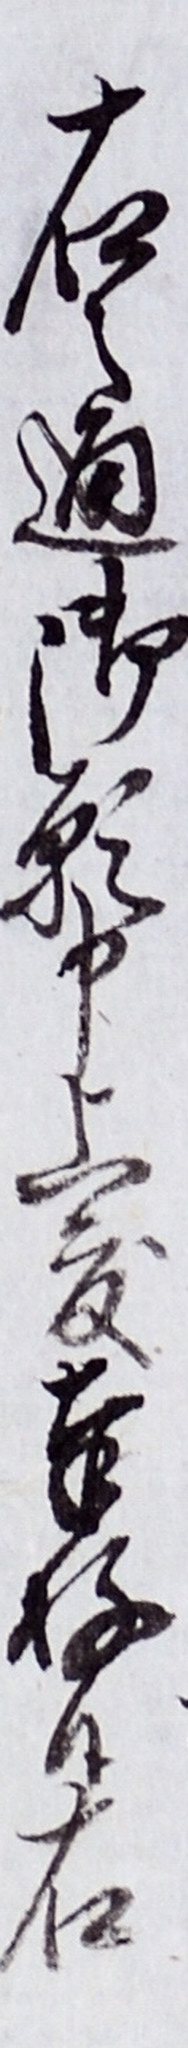右之通御願申上度奉存候右
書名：御山奉行御用控
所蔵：伊那市立高遠町図書館・合同会社AMANE
